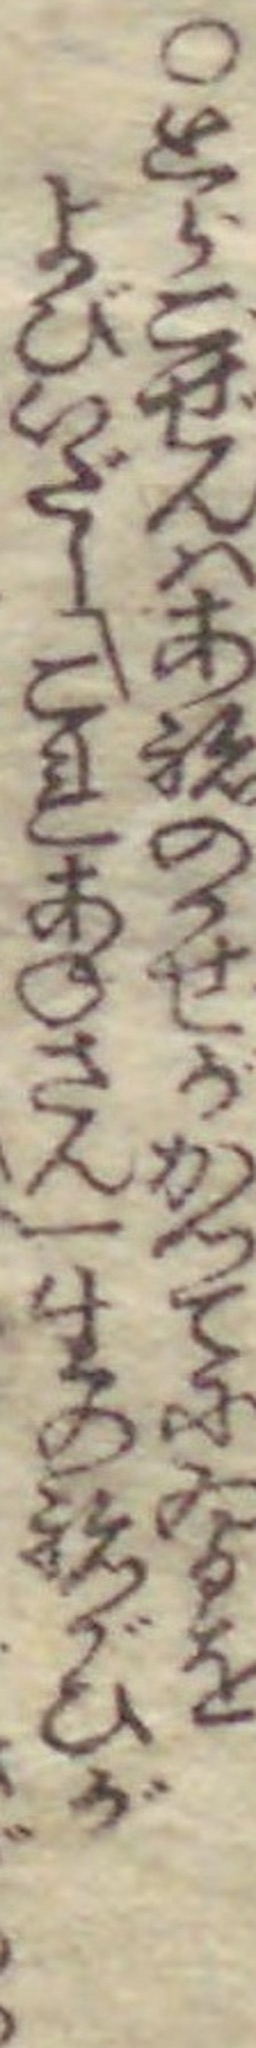よびいだし〽これあねさん一生のねがひが
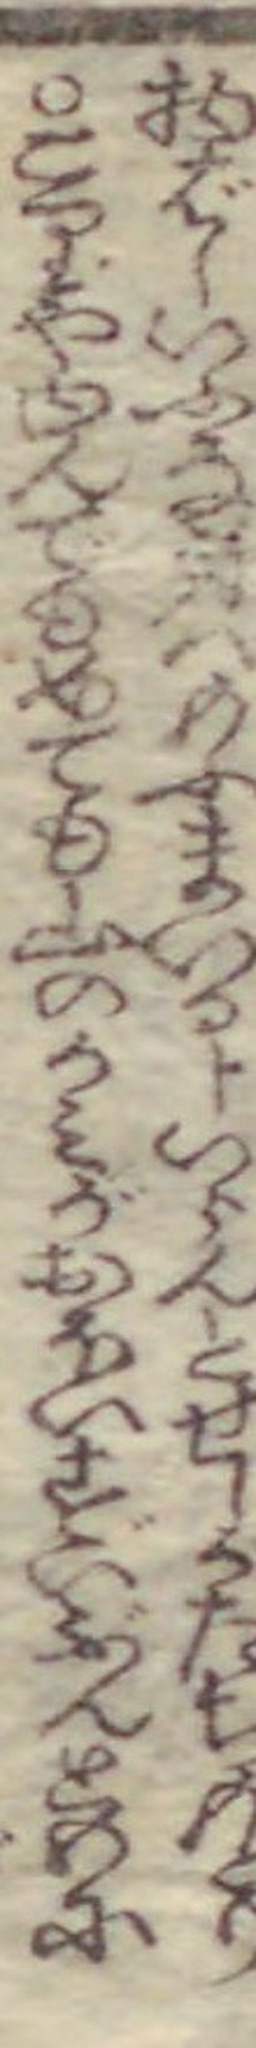○こりやゆんでもめても山のかみがおほいずいぶんともに
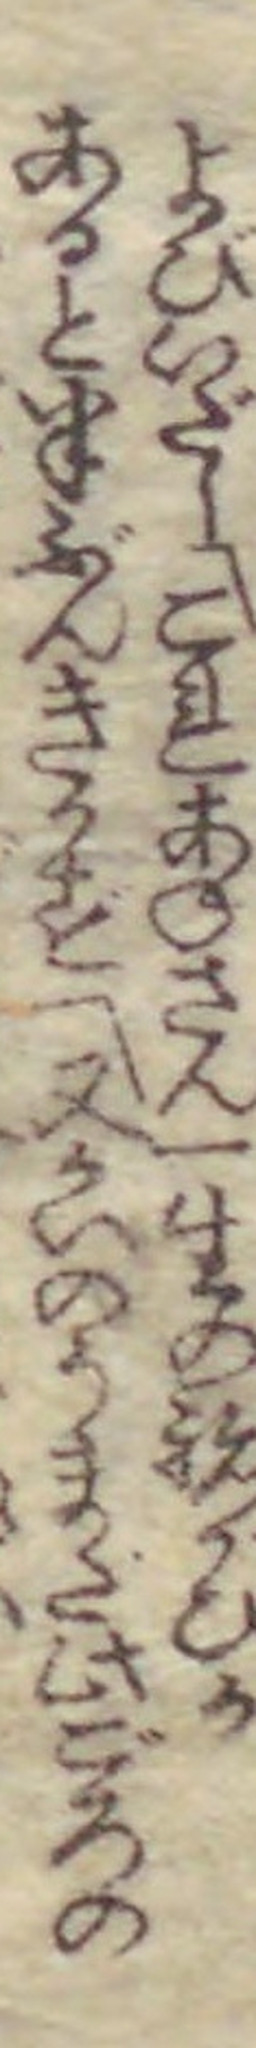あると半ぶんきかず〽又かいのうまだ此ごろの
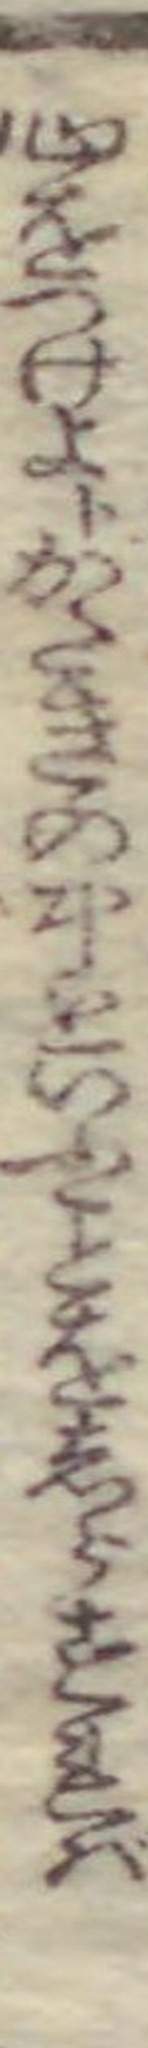心をつけよとかたきの中といふことをしらすれば
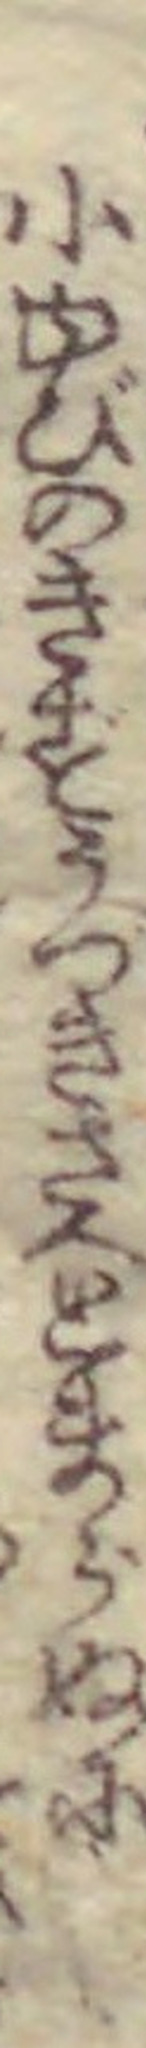小ゆびのきずうづきさへとまらぬに
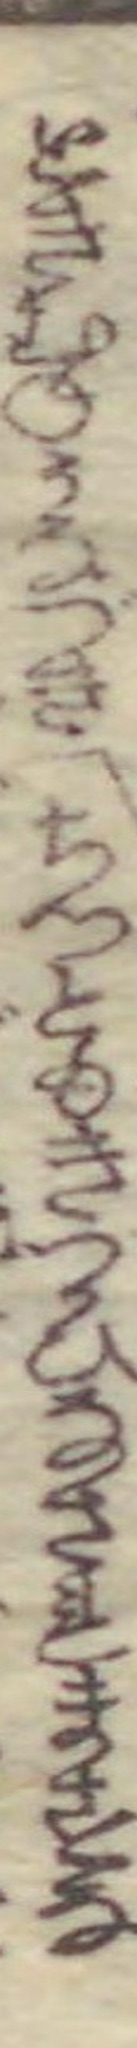ときむねうなづき〽ちつともきつかひなされますな
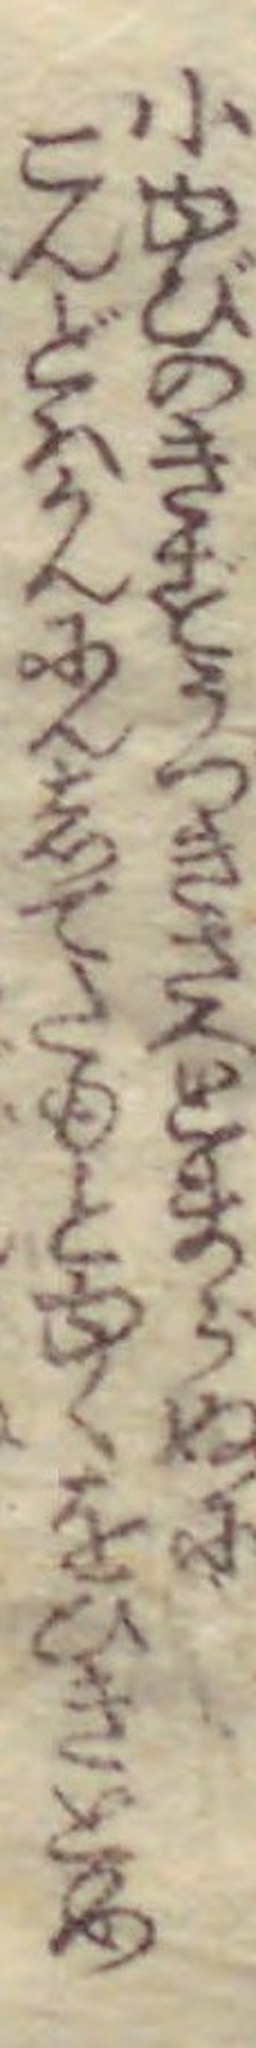こんどはかんにんしてたもとゆくをひきとめ
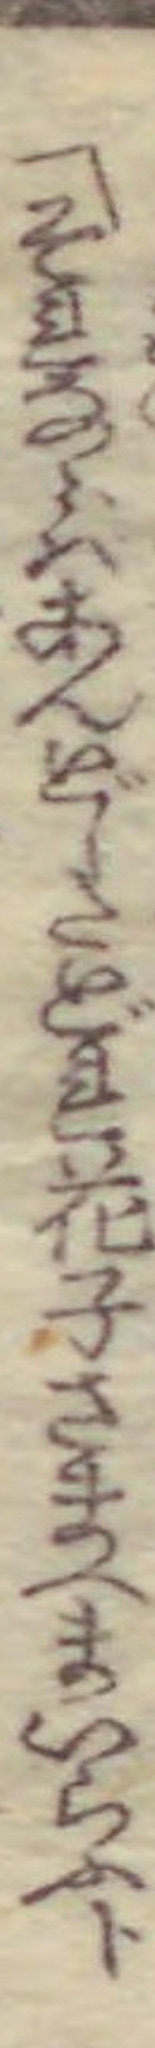〽それならはあんどしたどれ花子さまへまいらふと
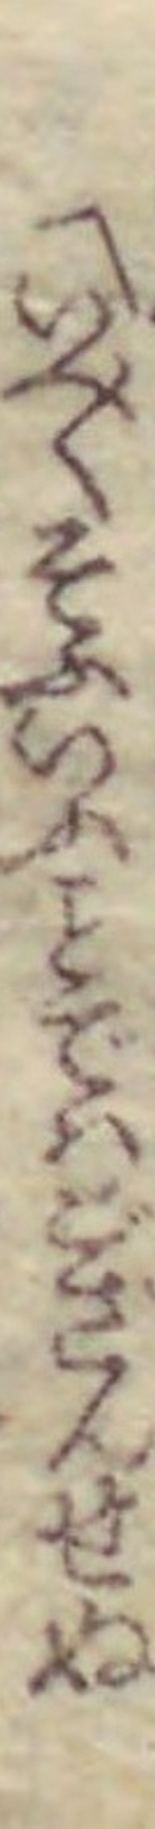〽いへ〴〵そふいふことではござんせぬ
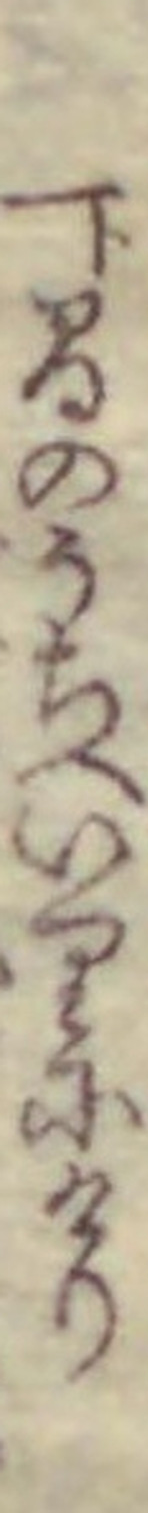一間のうちへいりにけり
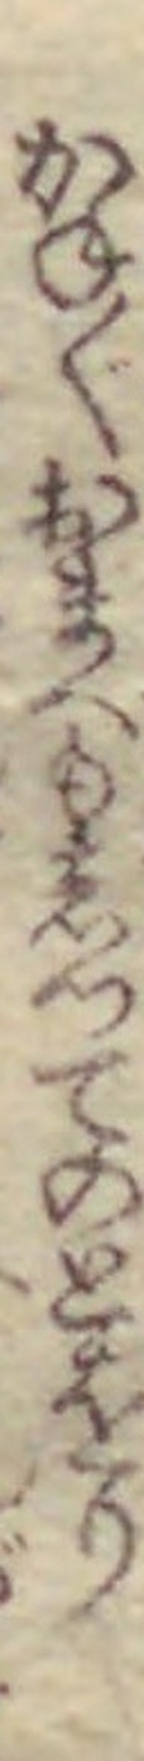かね〴〵おまへもしつてのとをり
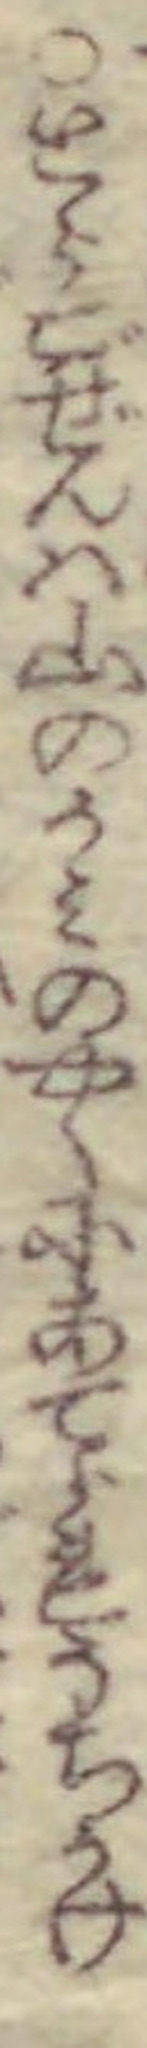○とらごぜんは山のかみのやくにあてられうちかけ
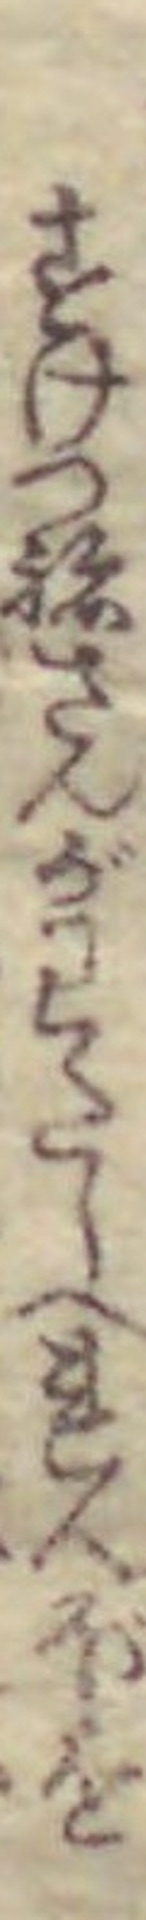すけつねさんがわたしへれんぼを
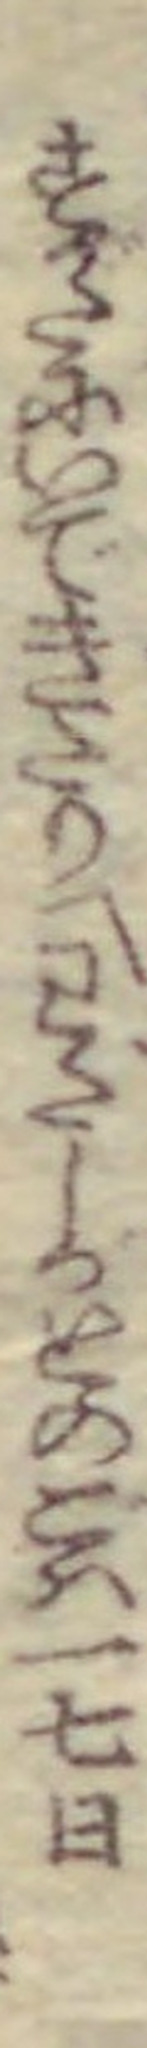すがたにいできたり〽わたしかとのごは十七日
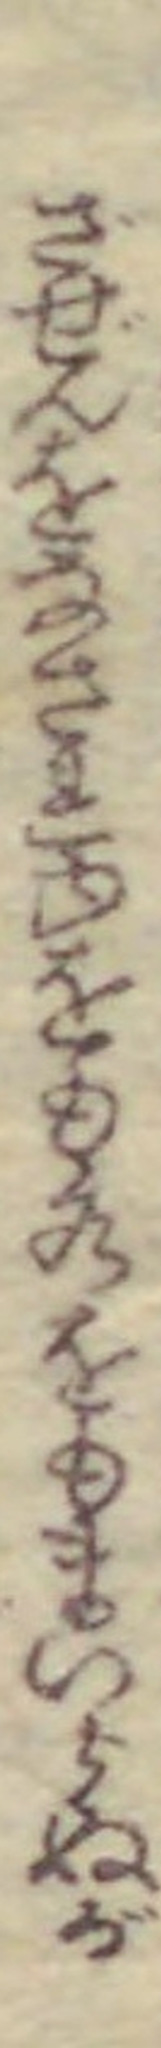ざぜんをなされゆをも水をもまいらぬが
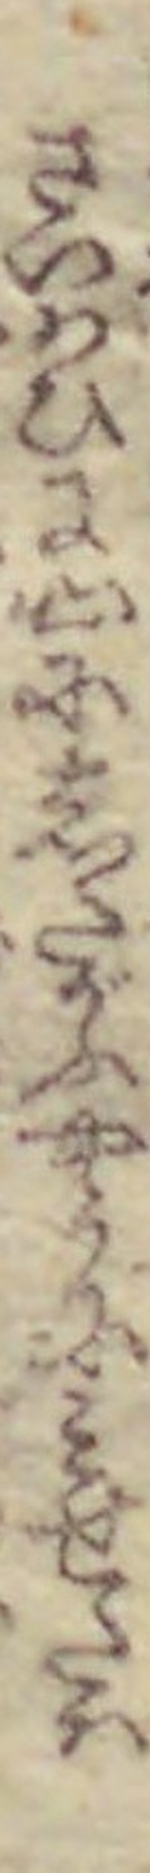さいはひに心にしたがふやうにみせたは
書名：大時代唐土化物 3巻. 曽我太夫染
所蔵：国立国会図書館 National Diet Library, JAPAN
